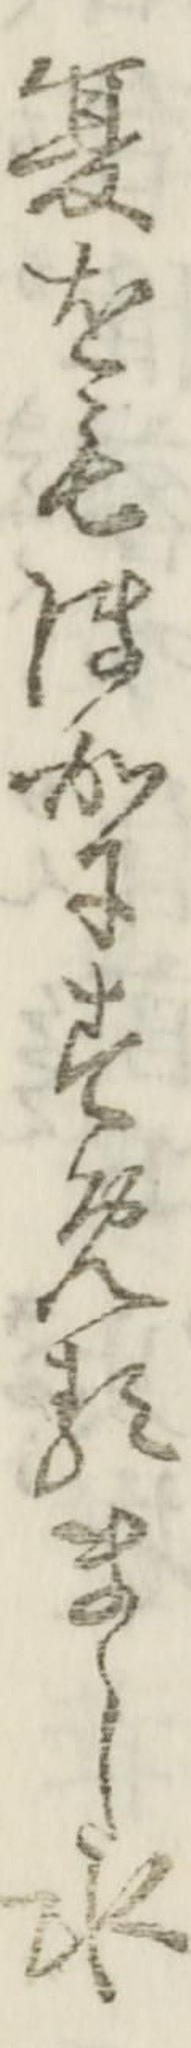夏をもほかにすめるまし水
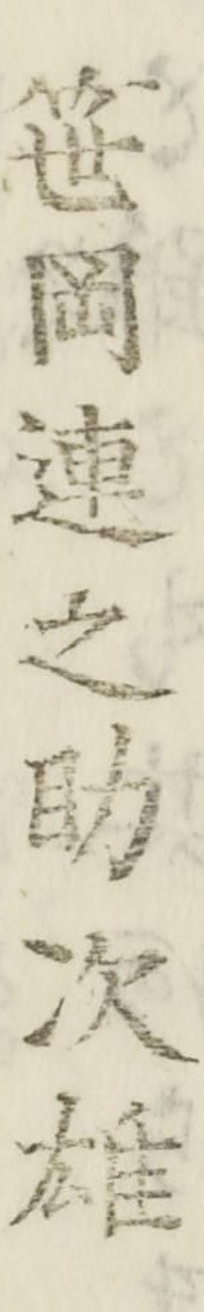や笹岡連之助次雄
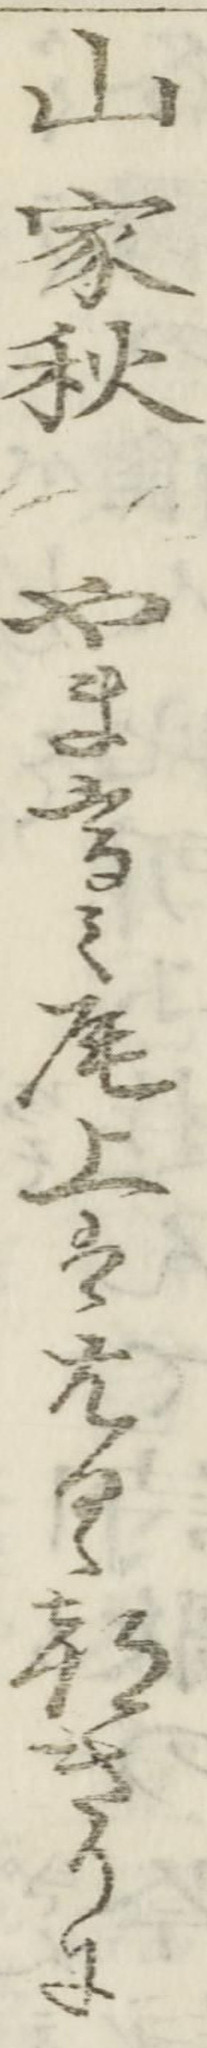山家秋やま高く尾上ははるゝ朝きりに
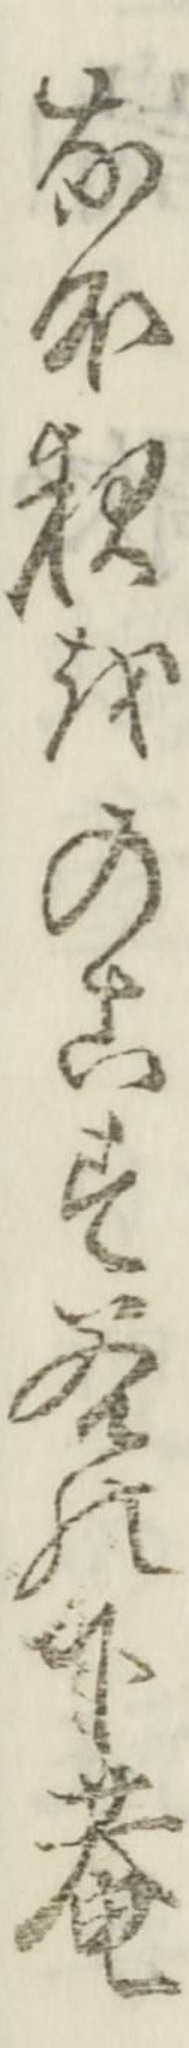なほ夜をのこす谷の下菴
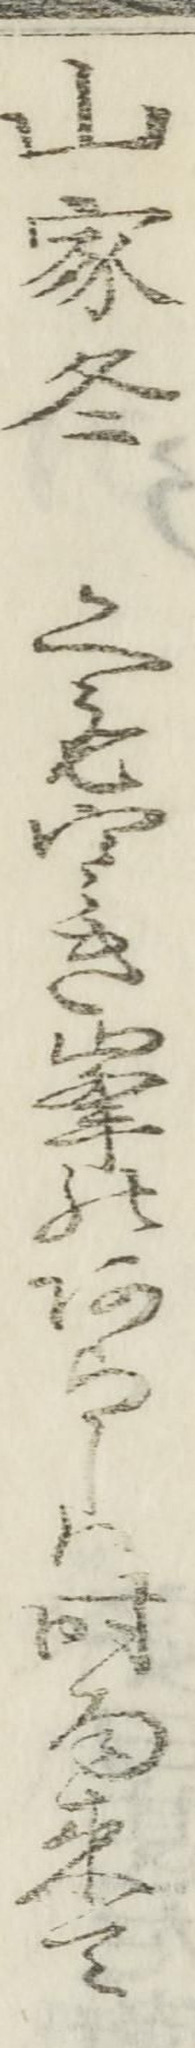山家冬くも寒き峯のあらしは時雨来て
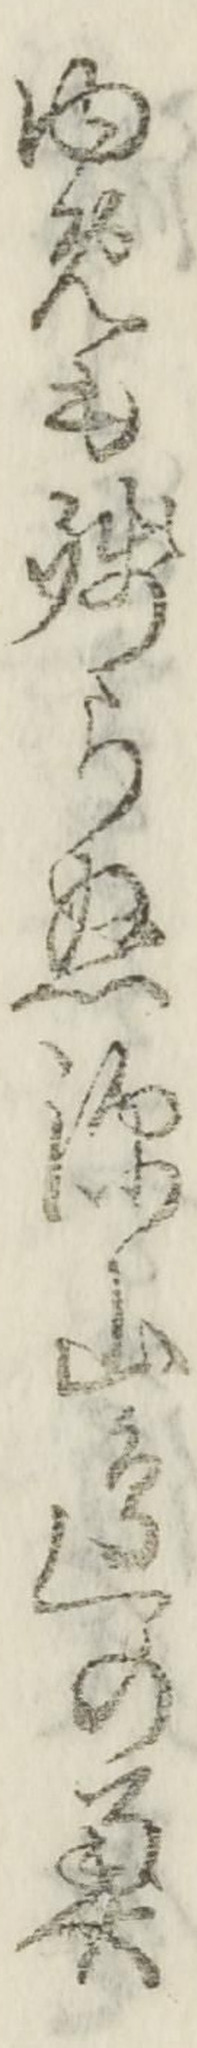ゆめも帰らぬ深山辺の奥
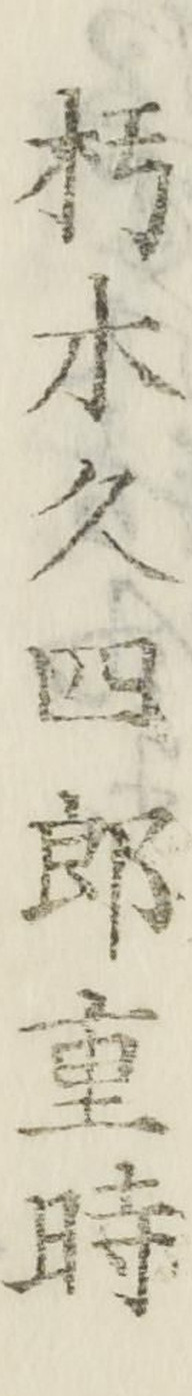し朽木久四郎重時
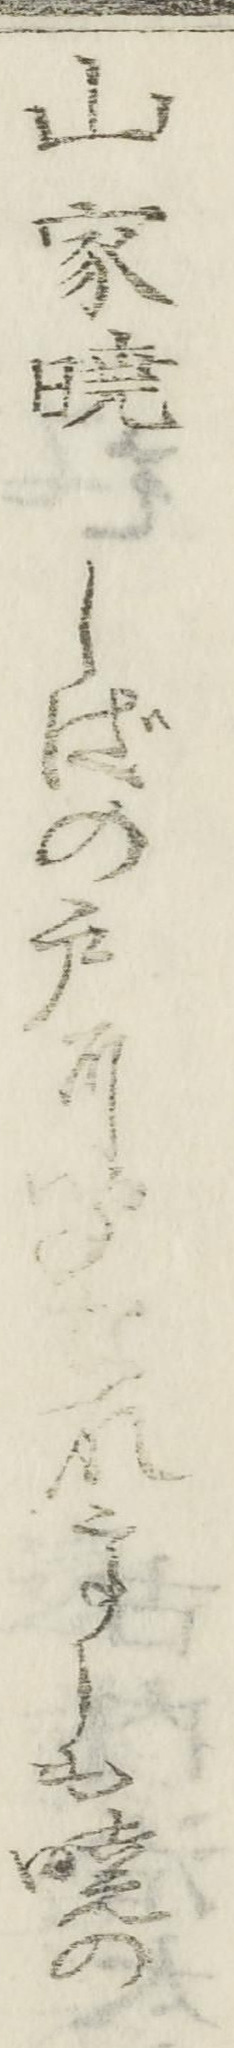山家暁しばの戸に聞なれ事しも暁の
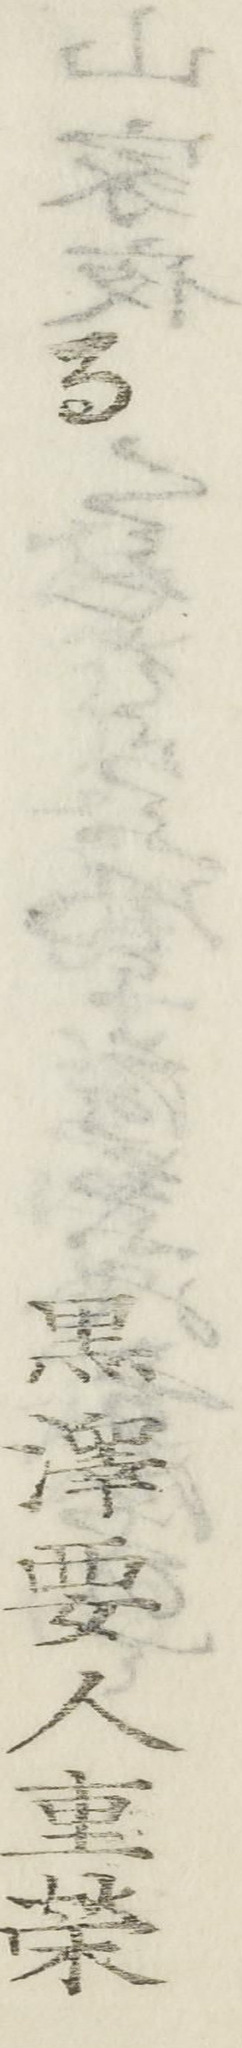る黒沢要人重栄
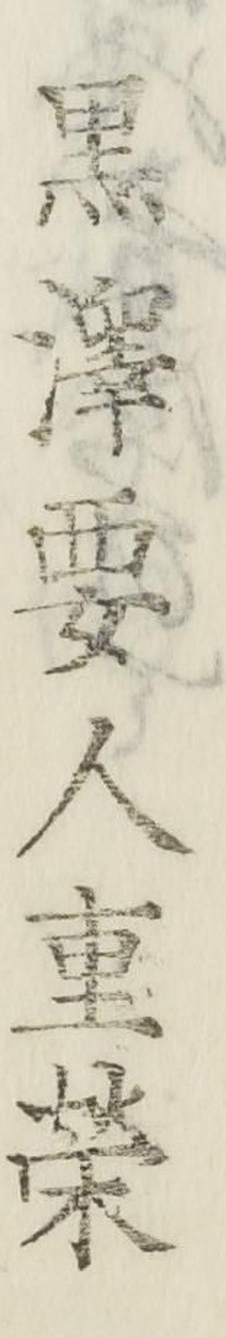る黒沢要人重栄
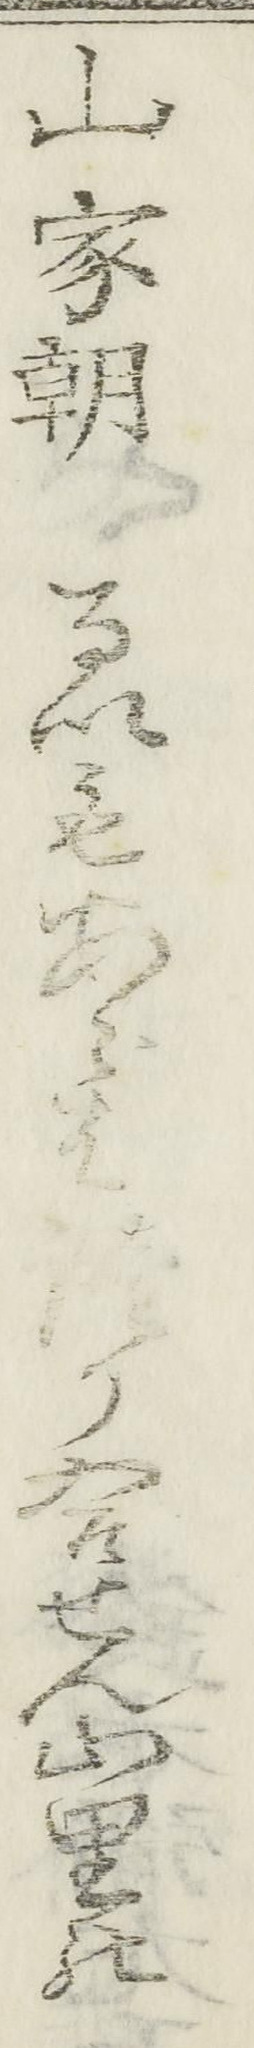山家朝るいもあらはり合せん山里の
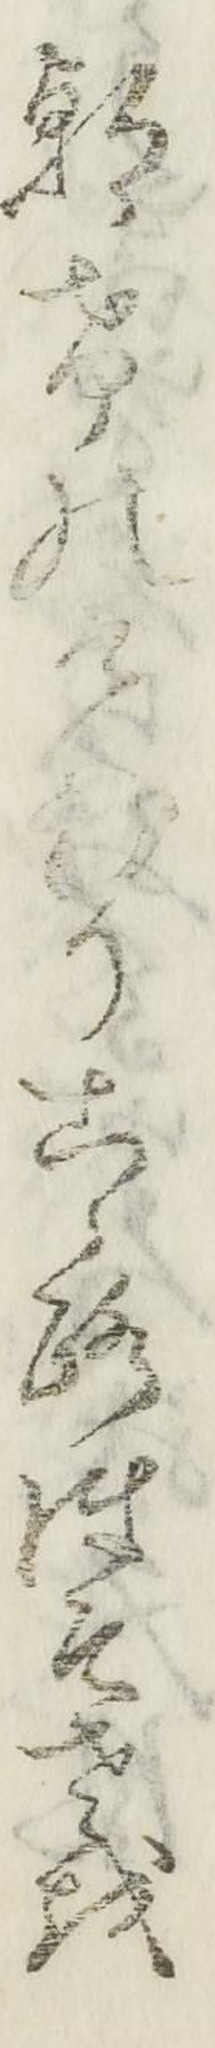朝けのけむり古路ほそさを
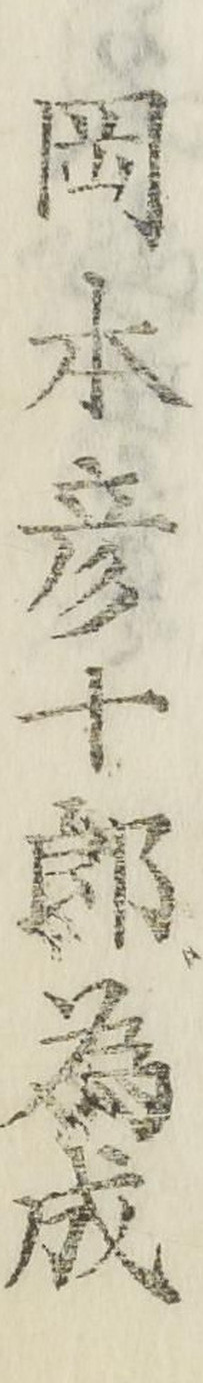り岡本彦十郎為成

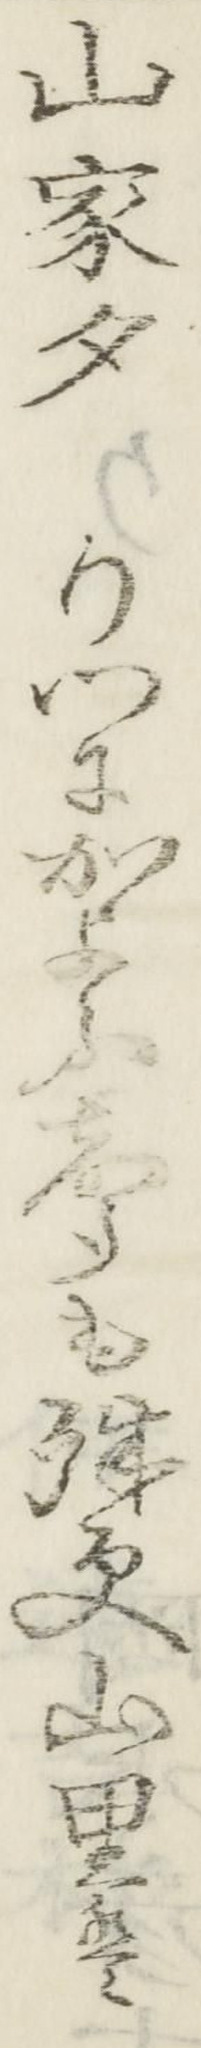山家夕りつにかよふ声も殊更山里は
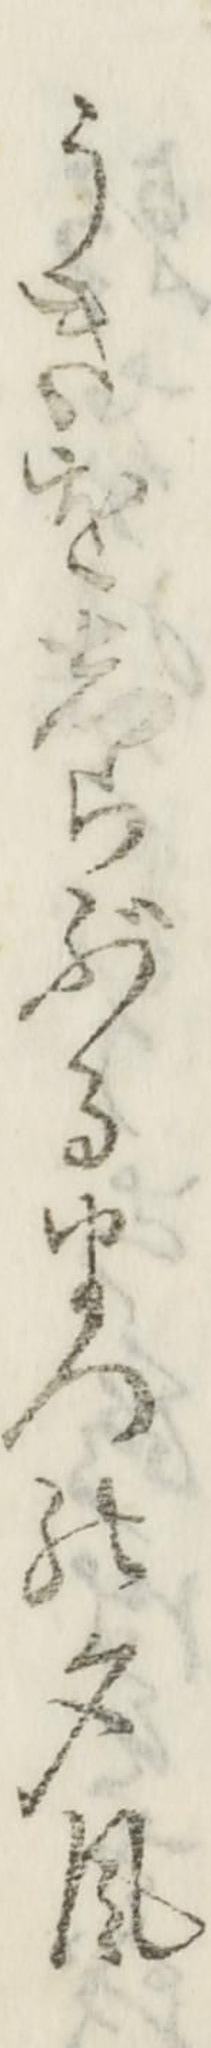うきをしらぶるまつの夕風
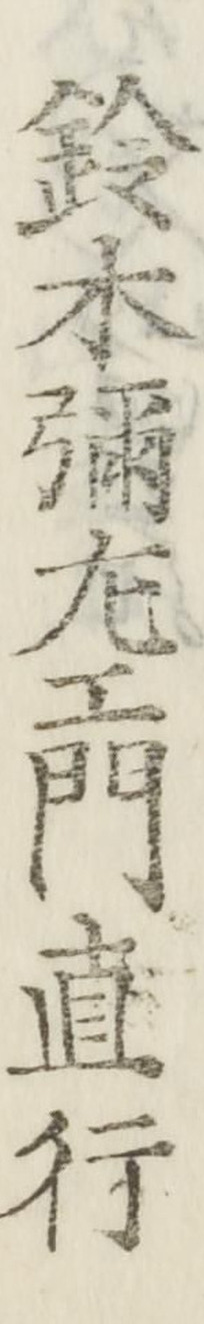く鈴木弥左エ門直行
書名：鎌先温泉由來記
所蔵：東京大学地震研究所図書室 Earthquake Research Institute Library, The University of Tokyo, JAPAN
